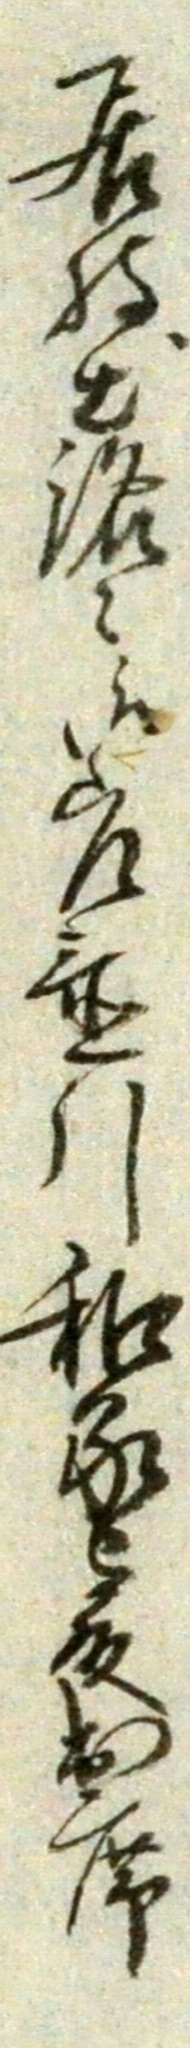居持出銘々御差置引和泉守殿出席
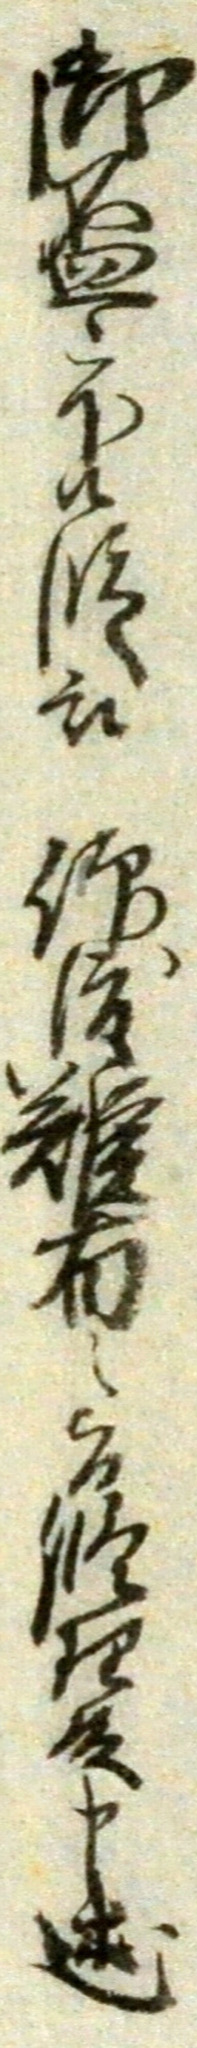御盃被下候段被仰渡難有之旨修理殿申述
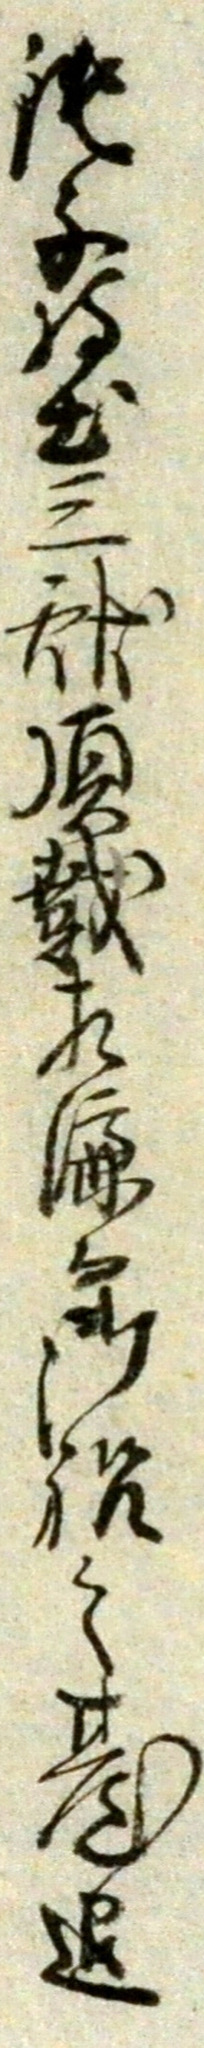銚子持出三献頂戴相済而御祝之臺退
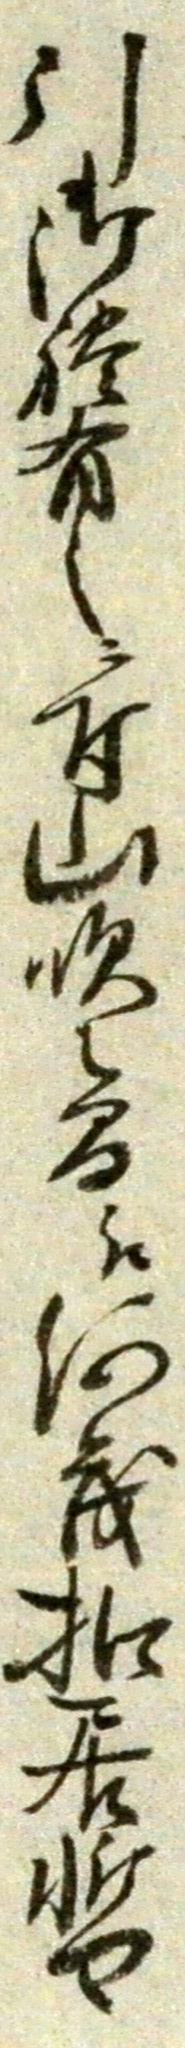引御禮有之ニ付山吹之間え何も扣居暫
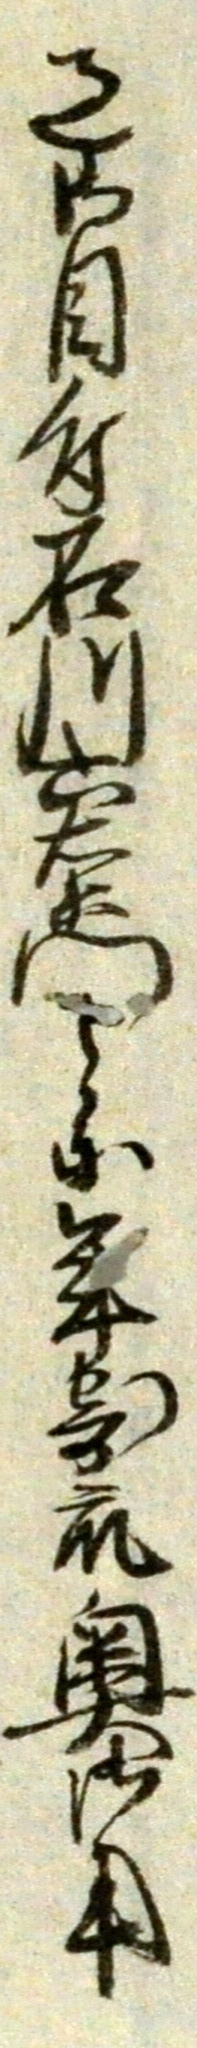過御目付石川六右衛門被参年寄衆奥御用
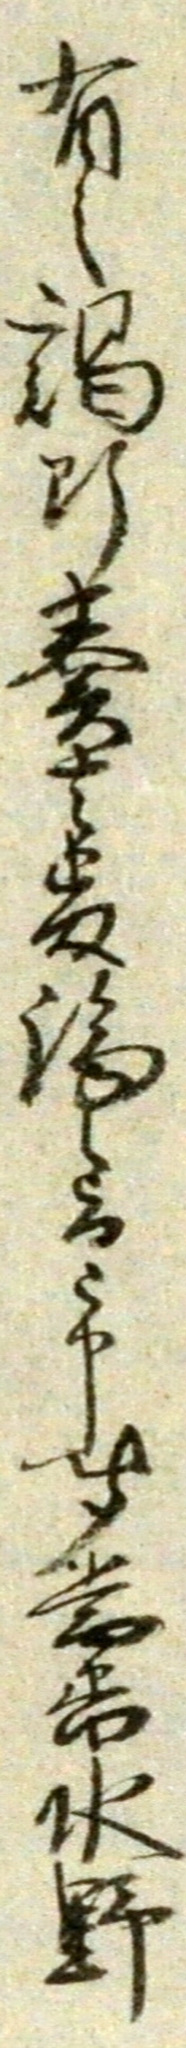有之謁断奏者番謁之旨被申聞當番水野
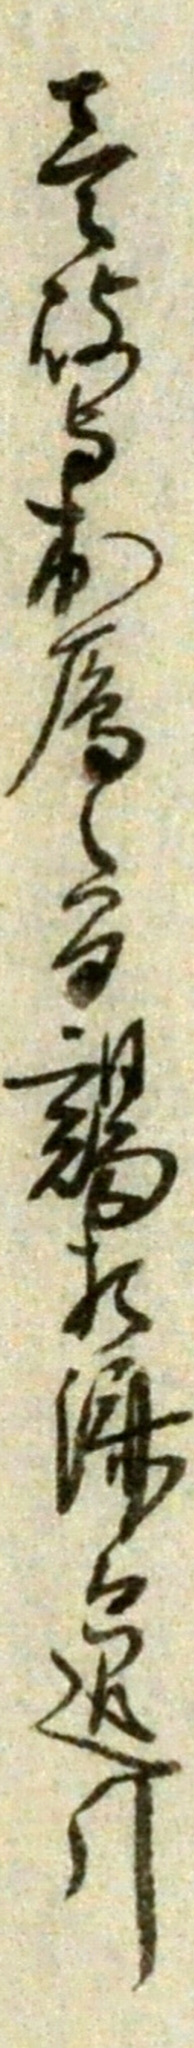壱岐守出雁之間謁相済而退引
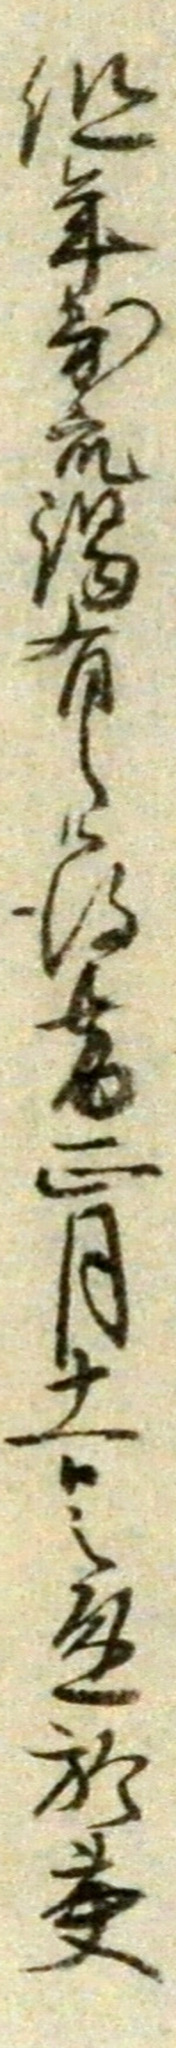但年寄衆謁有之候得は正月十一日之通於芙
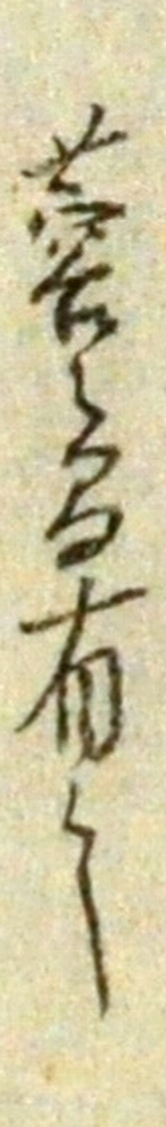蓉之間有之
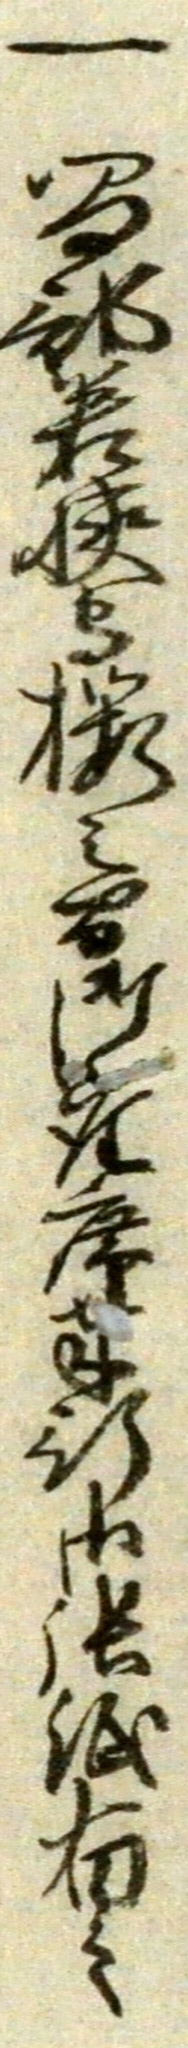一間部若狭守櫻之間御座席奉行御張紙有之
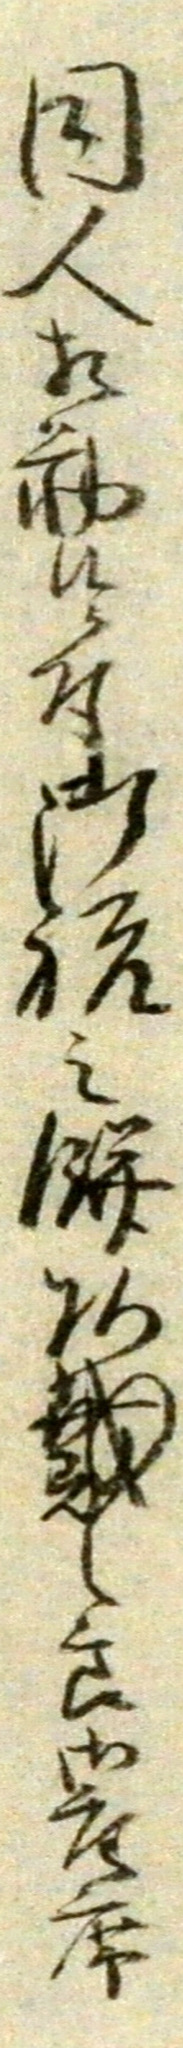同人相勤候ニ付御祝之餅頂戴之節御座席
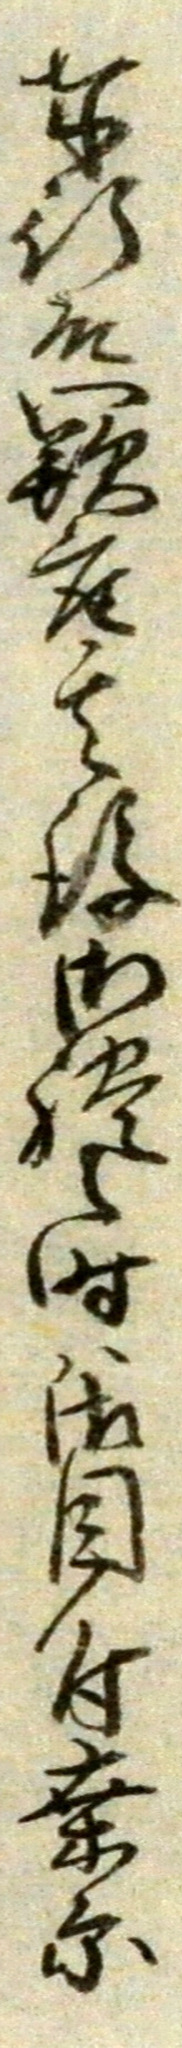奉行衆闕座其後御禮之時ハ御目付桑原
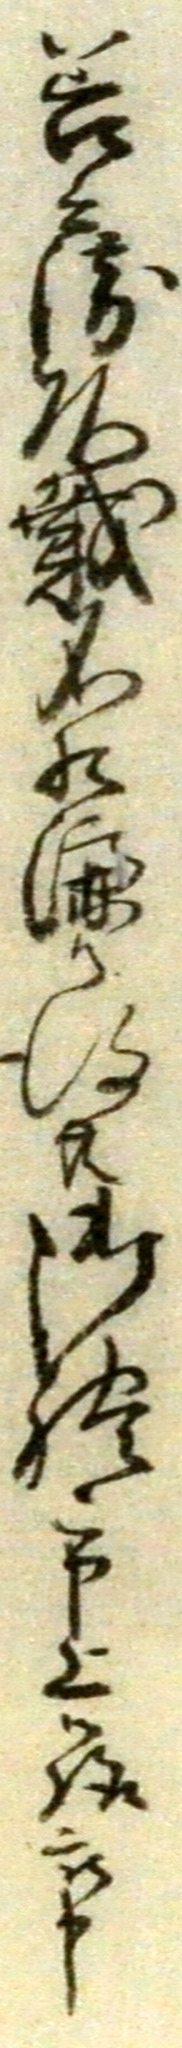善兵衛頂戴不相済候得共御禮被申上候様被申
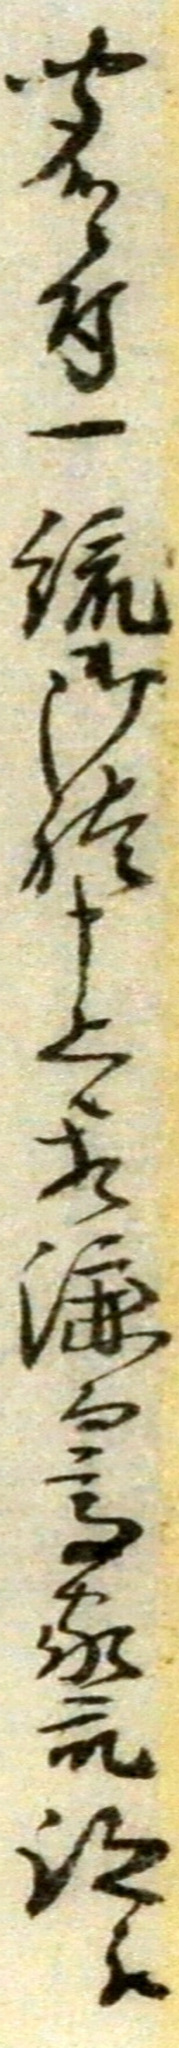聞候ニ付一統御禮申上候相済而高家衆跡え
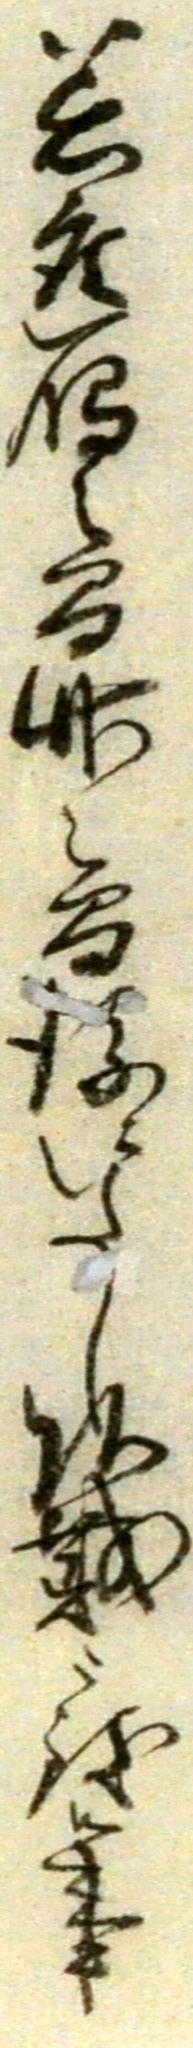着座雁之間竹之間後ニいたし頂戴被致候事
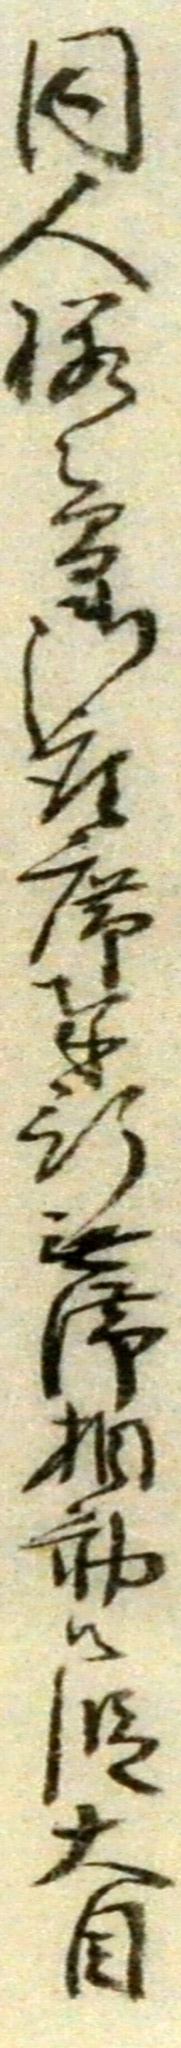同人櫻之間御座席奉行無席滞相勤候段大目
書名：若君様（家斉嫡男）誕生諸祝儀ノ節ノ留書外
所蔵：伊那市立高遠町図書館・合同会社AMANE
